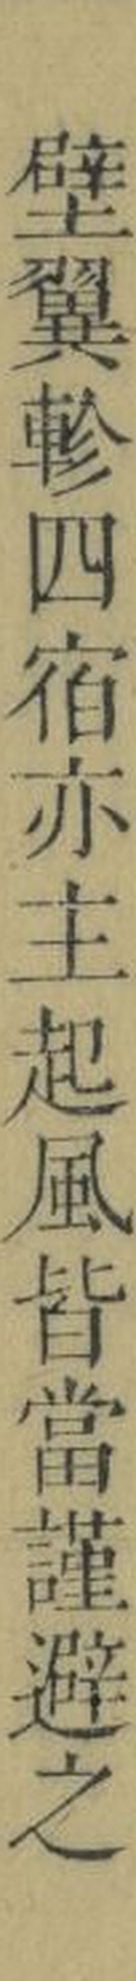壁翼軫四宿亦主起風皆當謹避之
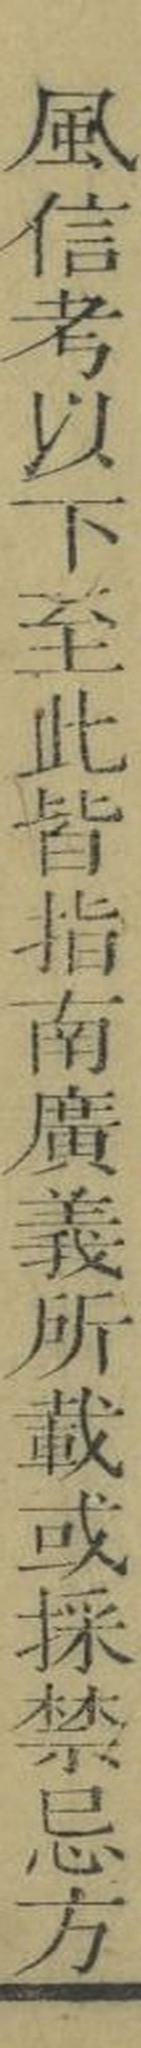風信考以下至此皆指南廣義所載或採禁忌方
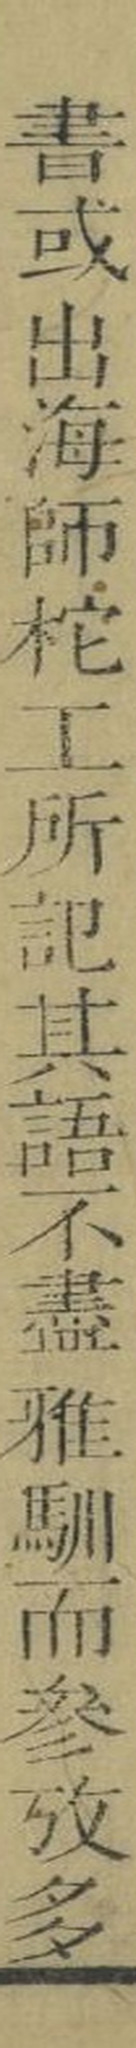書或出海師柁工所記其語不盡雅馴而參攷多

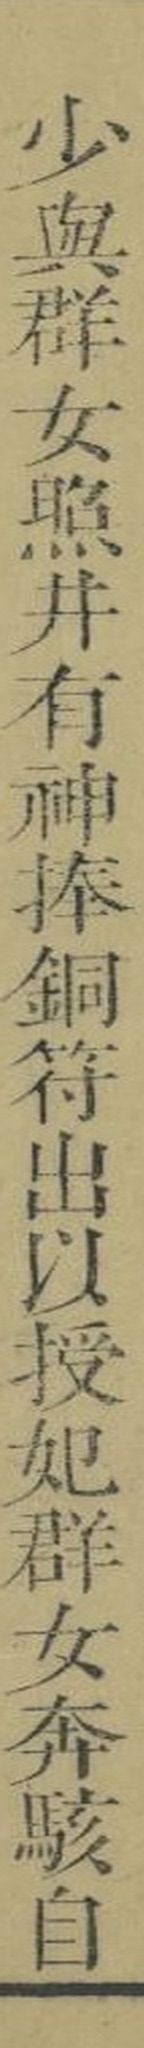少與群女照井有神捧銅符出以授妃群女奔駭自
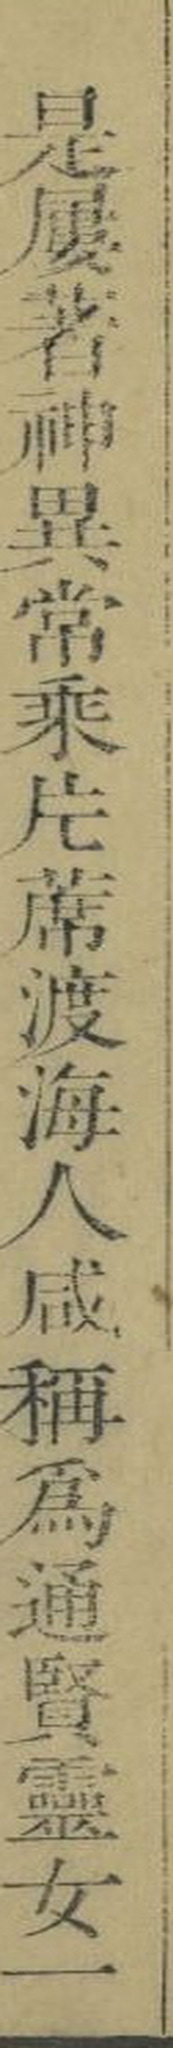是屢著神異常乘片蓆渡海人咸稱爲通賢靈女一
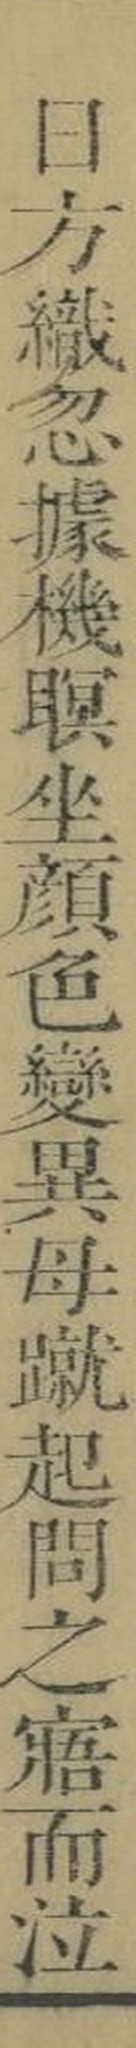日方織忽據機瞑坐顔色變異母蹴起問之寤而泣
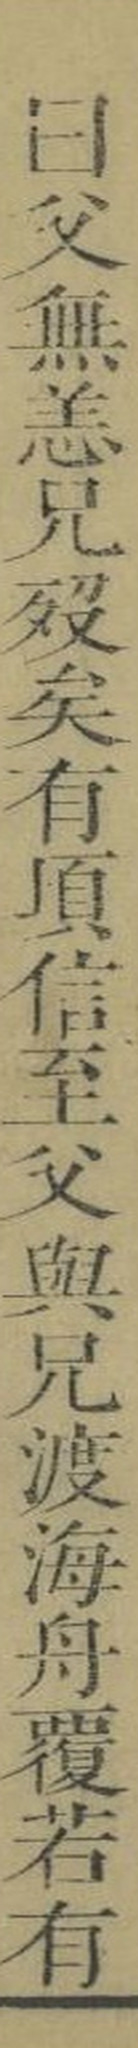曰父無恙兄歿矣有頃信至父與兄渡海舟覆若有
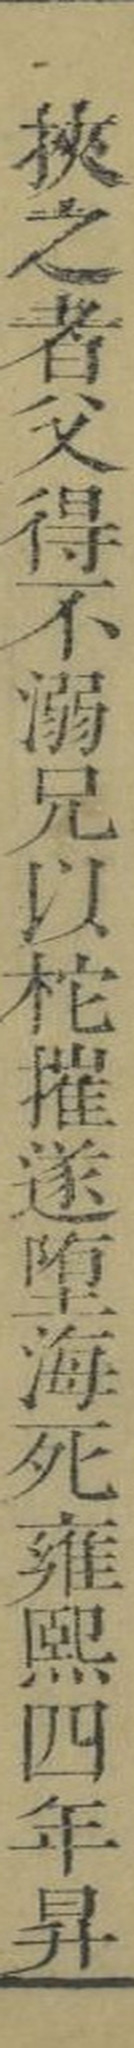挾之者父得不溺兄以柁摧遂堕海死雍熙四年昇

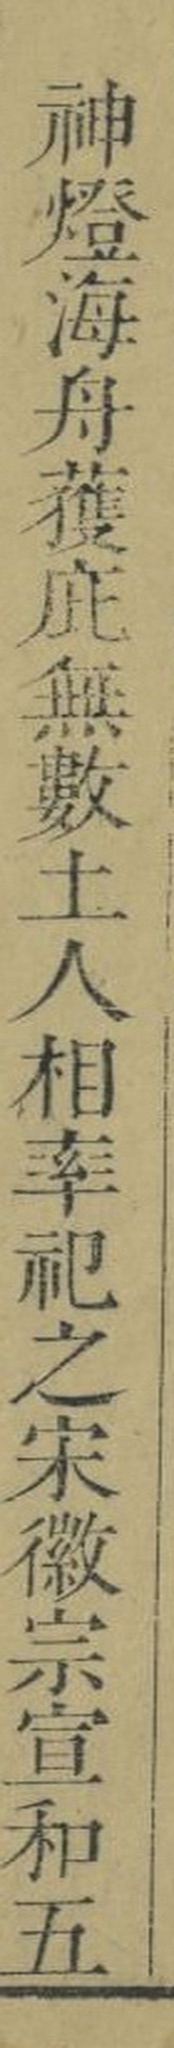神燈海舟獲庇無數土人相率祀之宋徽宗宣和五
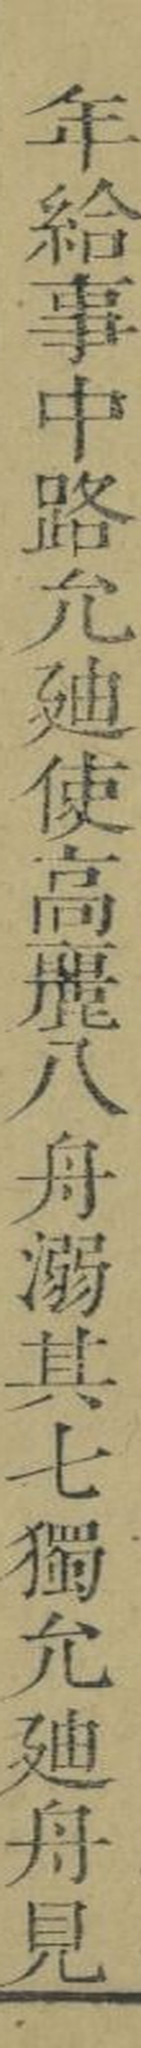年給事中路允廸使高麗八舟溺其七獨允廸舟見
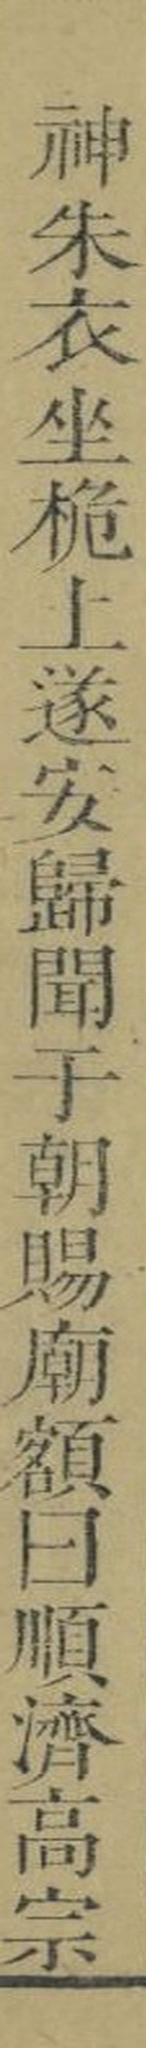神朱衣坐桅上遂安歸聞于朝賜廟額曰順濟高宗
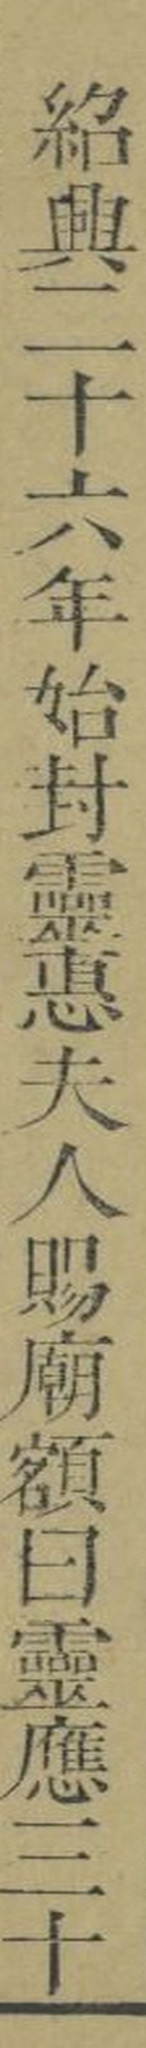紹興二十六年始封靈惠夫人賜廟額曰靈應三十
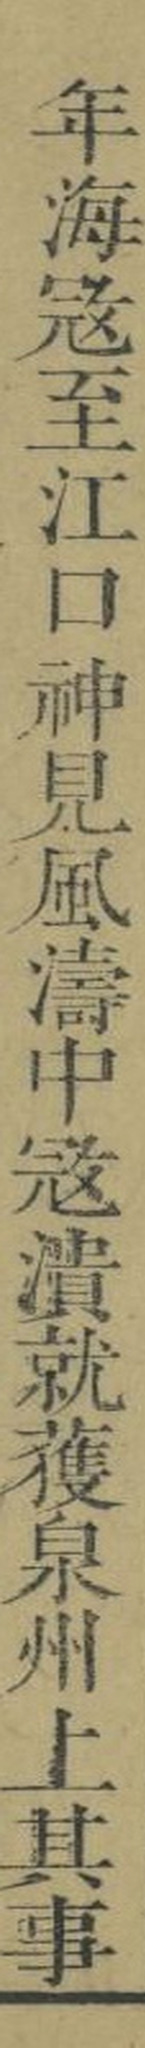年海冦至江口神見風濤中冦潰就獲泉州上其事
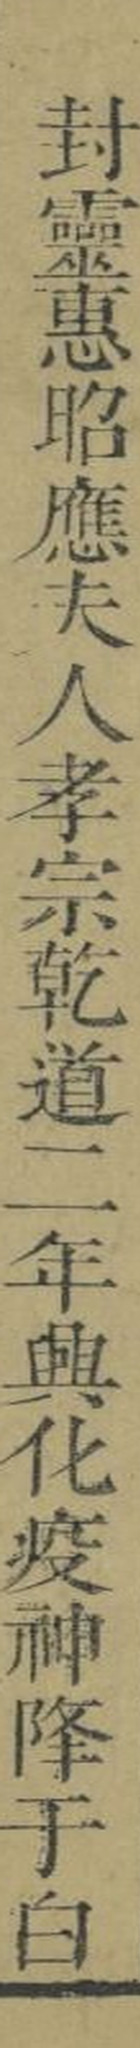封靈惠昭應夫人孝宗乾道二年興化疫神降于白
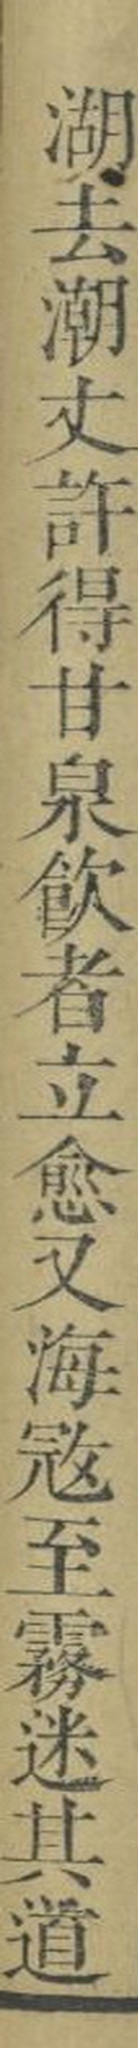湖去潮丈許得甘泉飮者立愈又海冦至霧迷其道
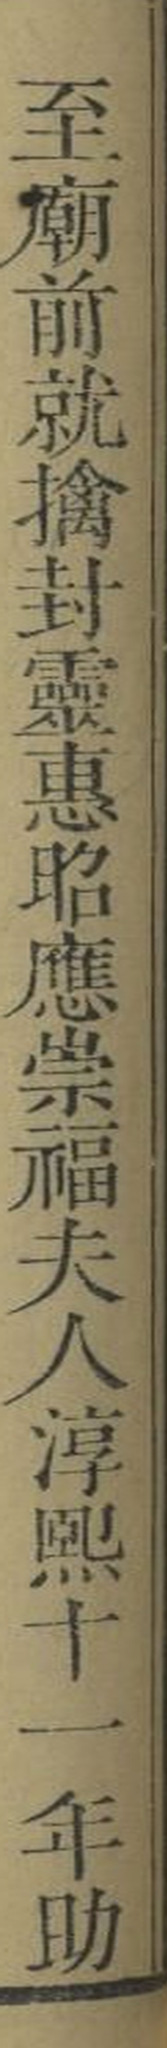至廟前就擒封靈惠昭應崇福夫人淳熙十一年助
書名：中山伝信録 巻一
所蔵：University of the Ryukyus Library
